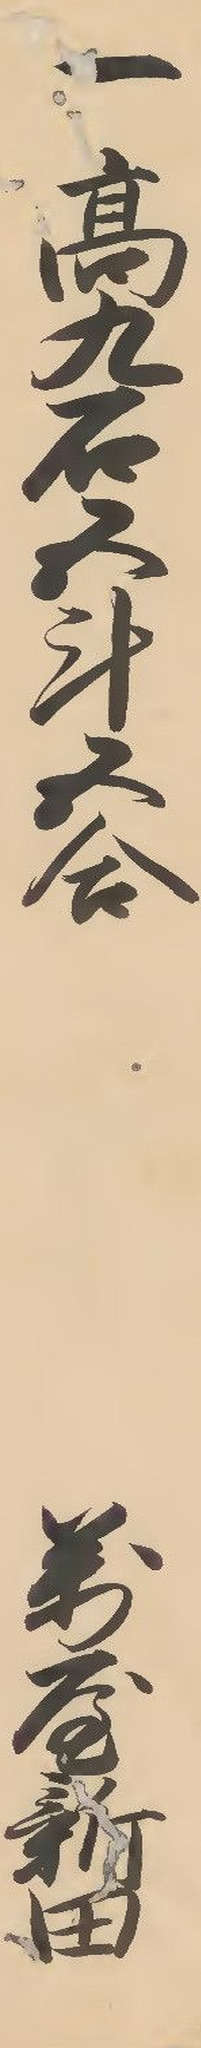一高九石五斗五合万屋新田
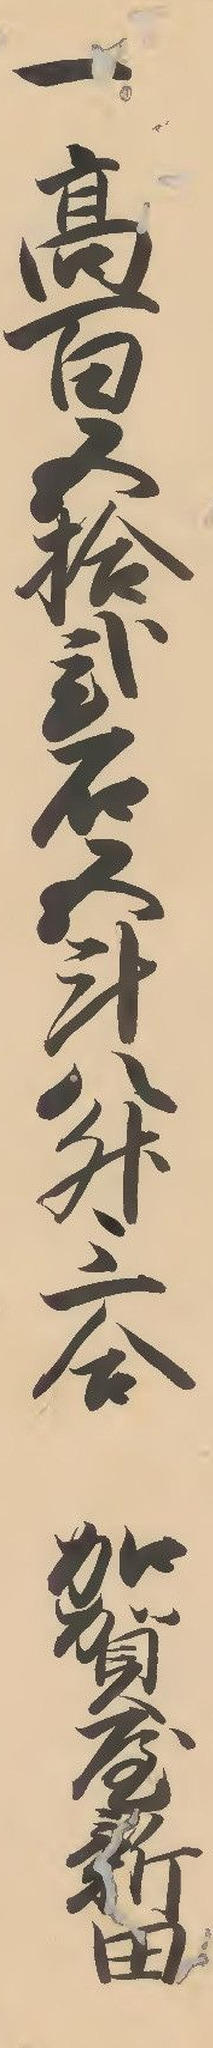一高百五拾弐石五斗八升三合加賀屋新田
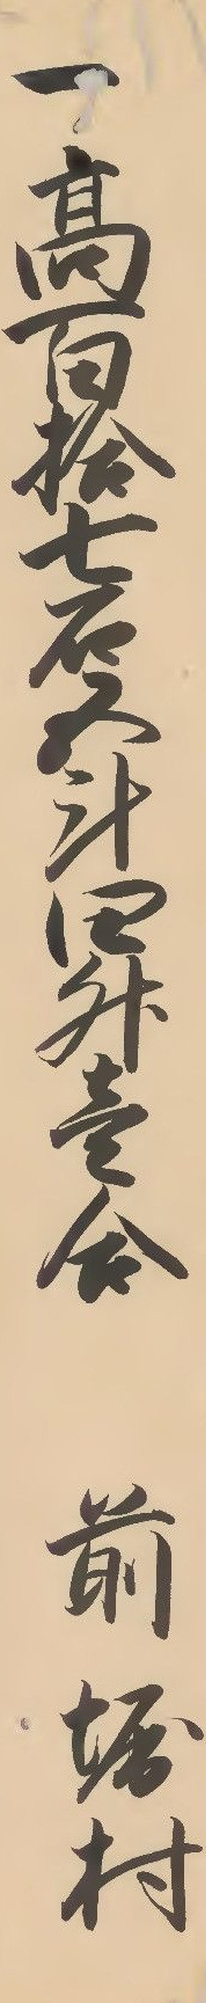一高百拾七石五斗四升壱合前堀村
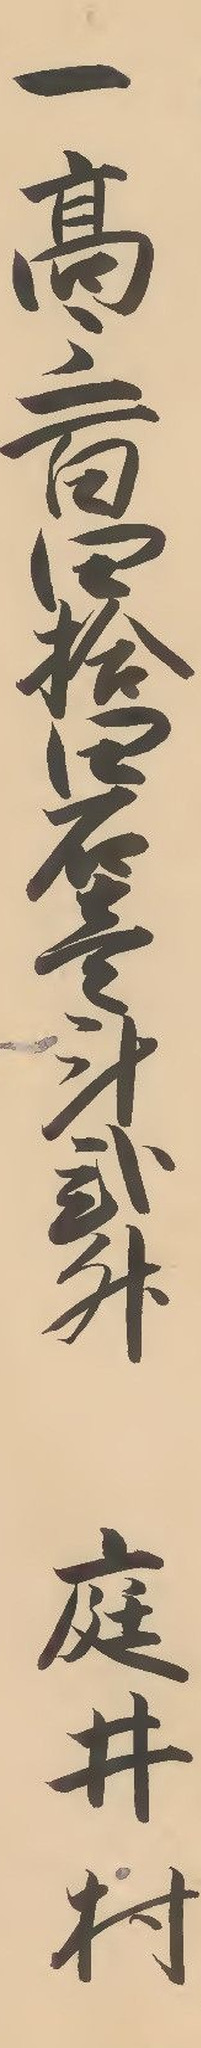一高三百四拾四石壱斗弐升庭井村

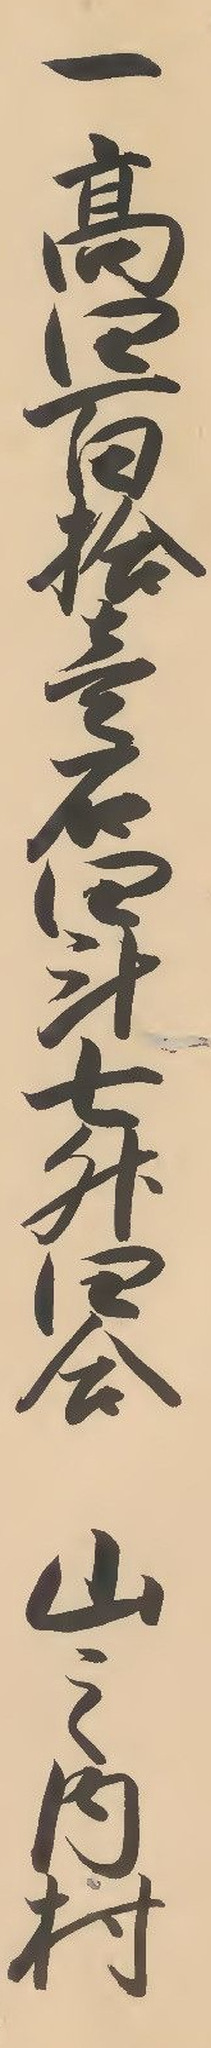一高四百拾壱石四斗七升四合山之内村
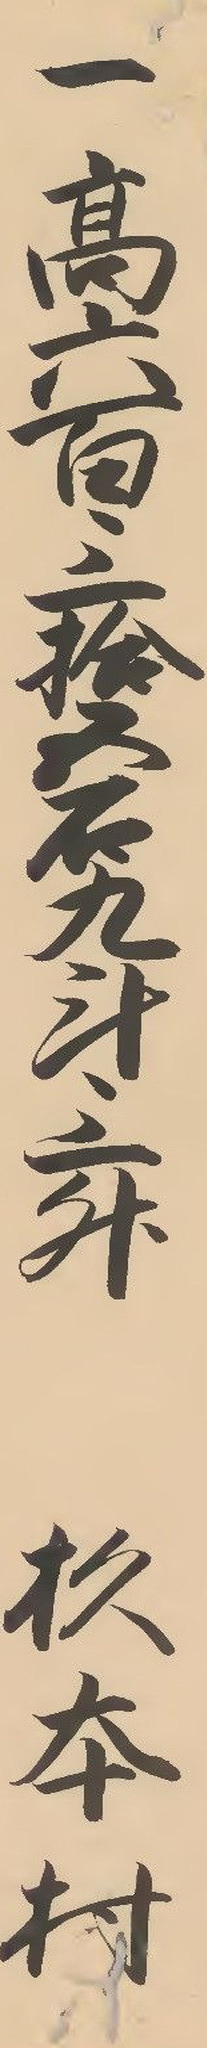一高六百三拾五石九斗三升杉本村
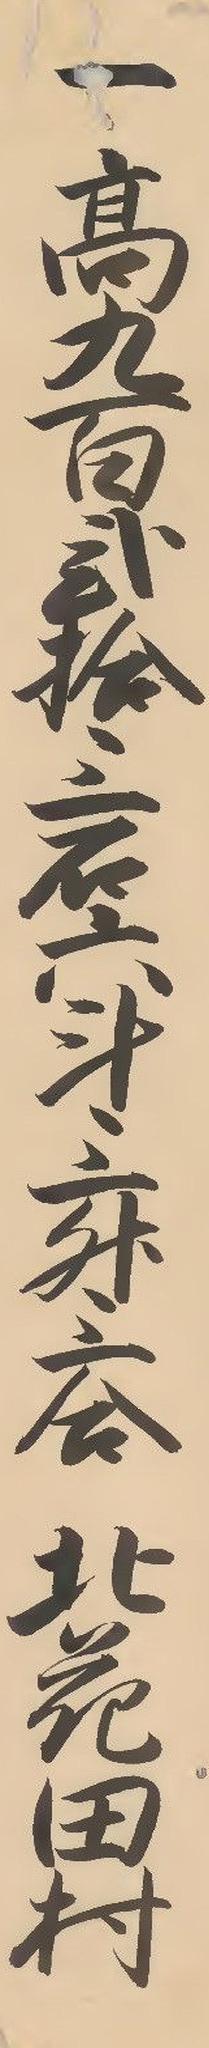一高九百弐拾三石六斗三升六合北花田村
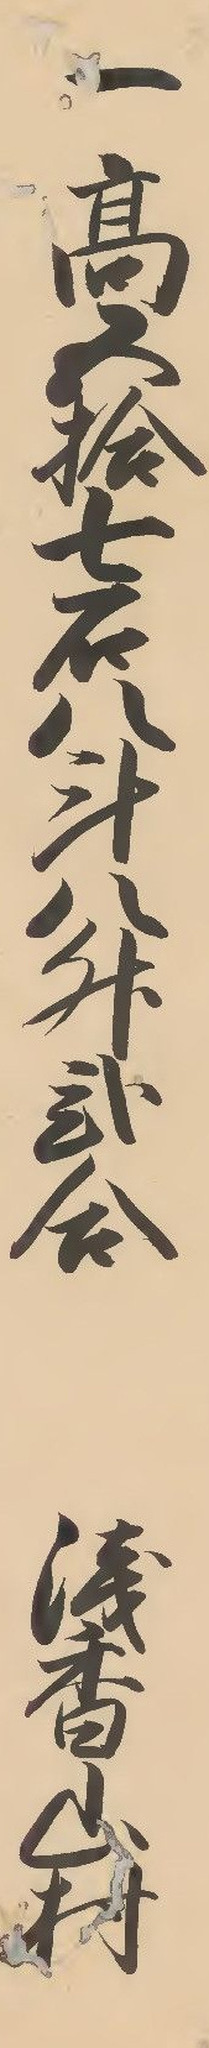一高五拾七石八斗八升弐合浅香山村
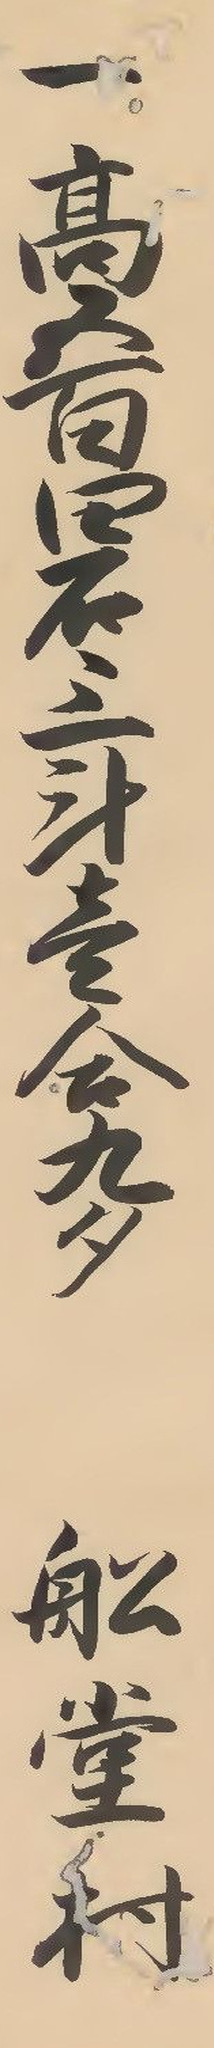一高五百四石三斗壱合九勺船堂村
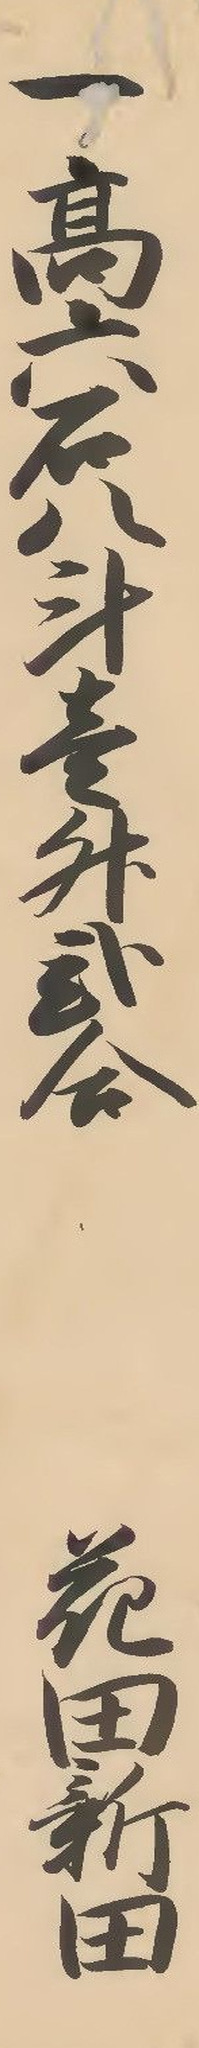一高六石八斗壱升弐合花田新田
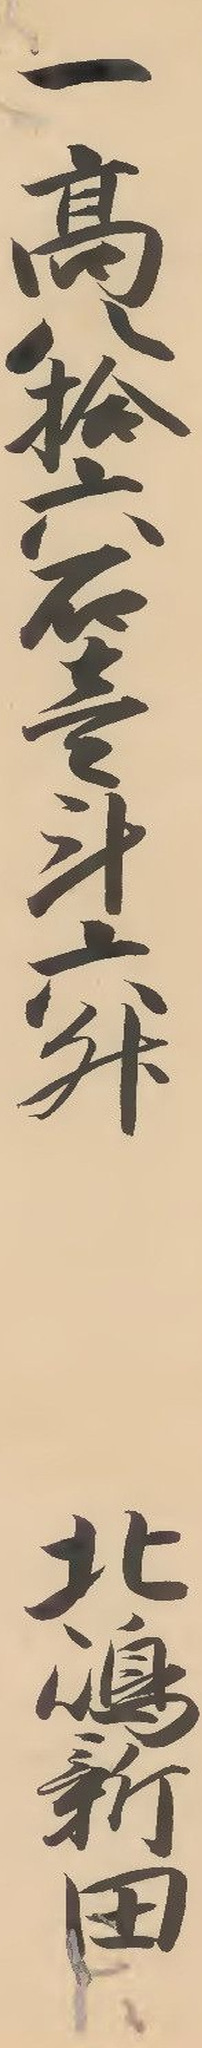一高八拾六石壱斗六升北島新田
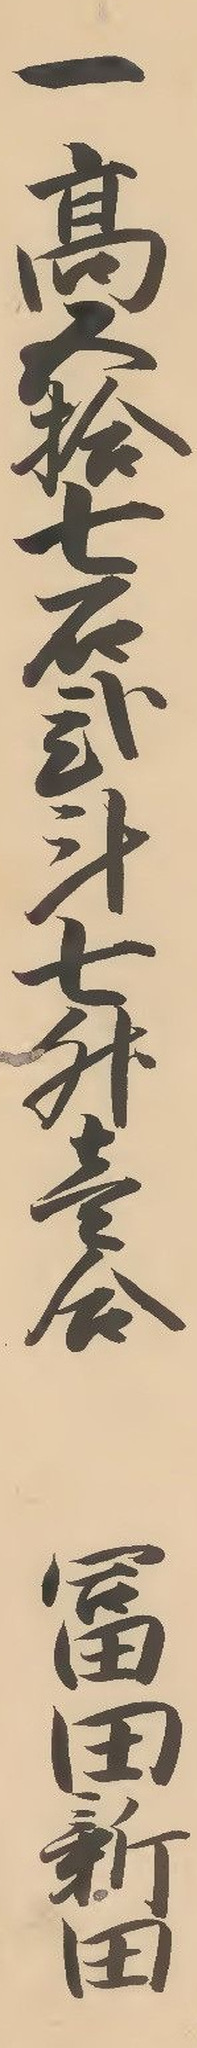一高五拾七石弐斗七升壱合富田新田

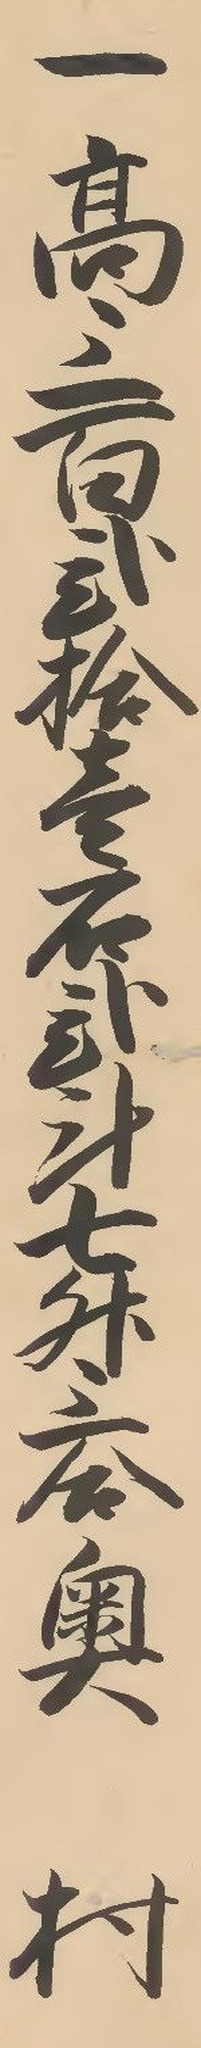一高三百弐拾壱石弐斗七升三合奥村
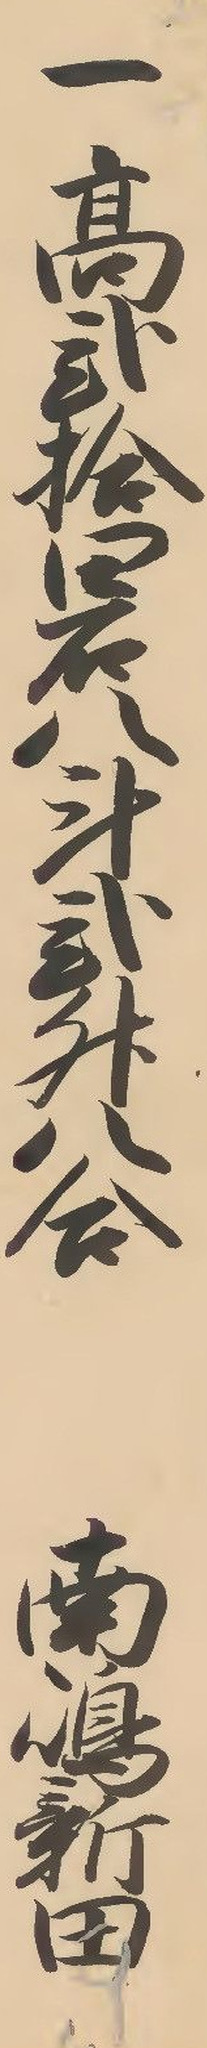一高弐拾四石八斗弐升八合南島新田
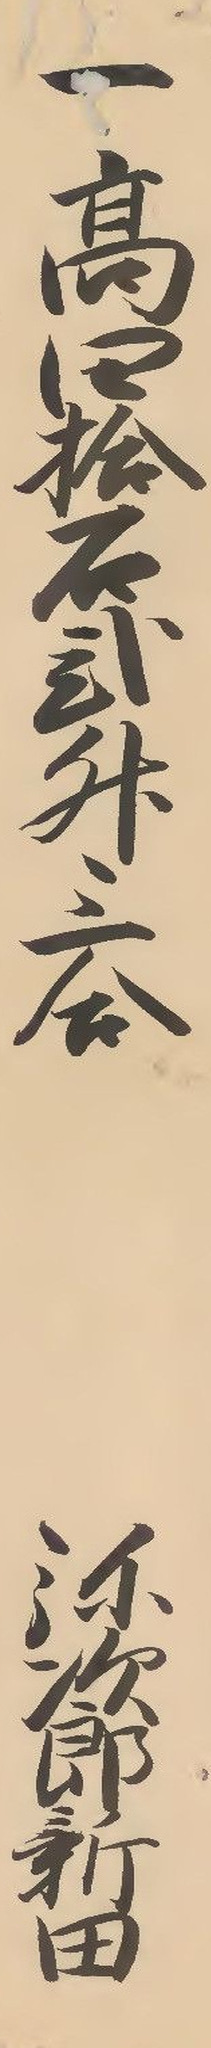一高四拾石弐升三合弥次郎新田
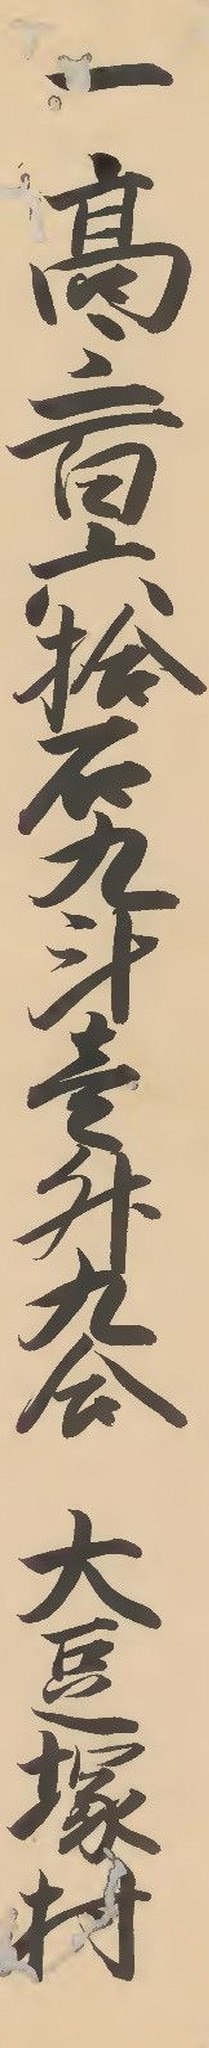一高三百六拾石九斗壱升九合大豆塚村
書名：摂津国郷帳
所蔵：国立公文書館 National Archives of Japan
